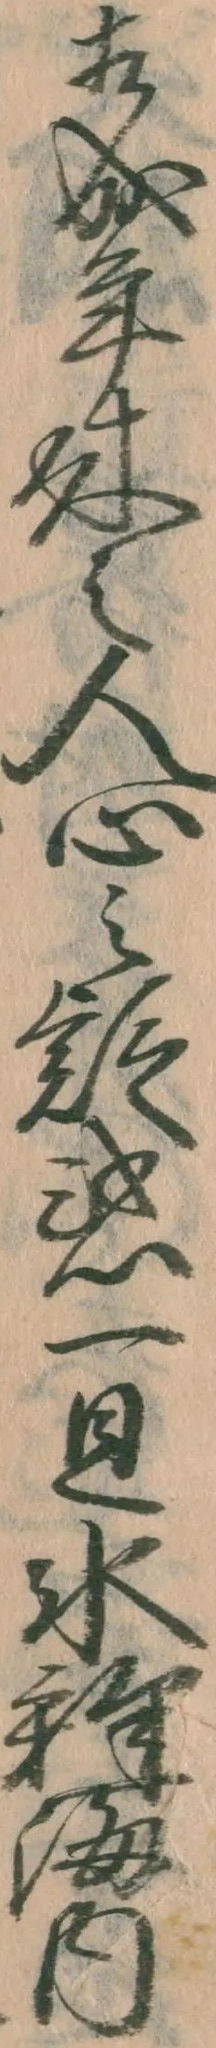相成年来之人心之疑惑一旦氷釋海内
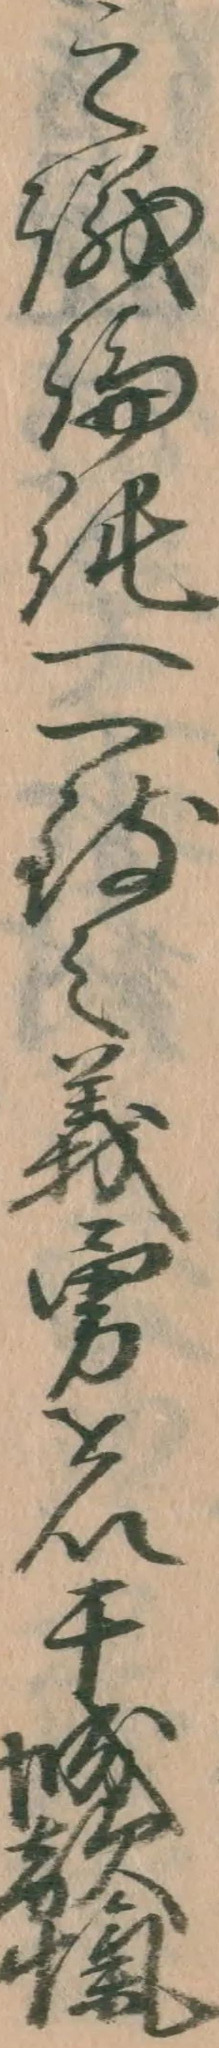之議論純一一致之義勇を以干城敵愾
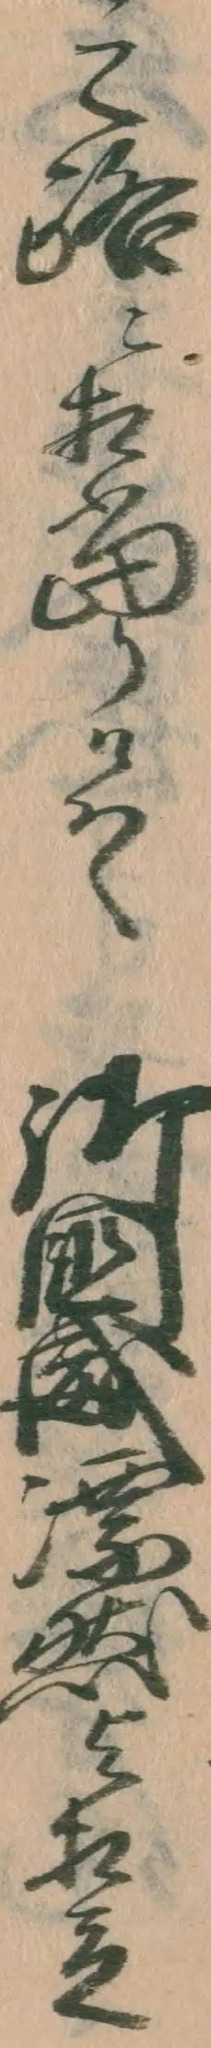之路にニ相當り候ハゝ御国威漂然と相立
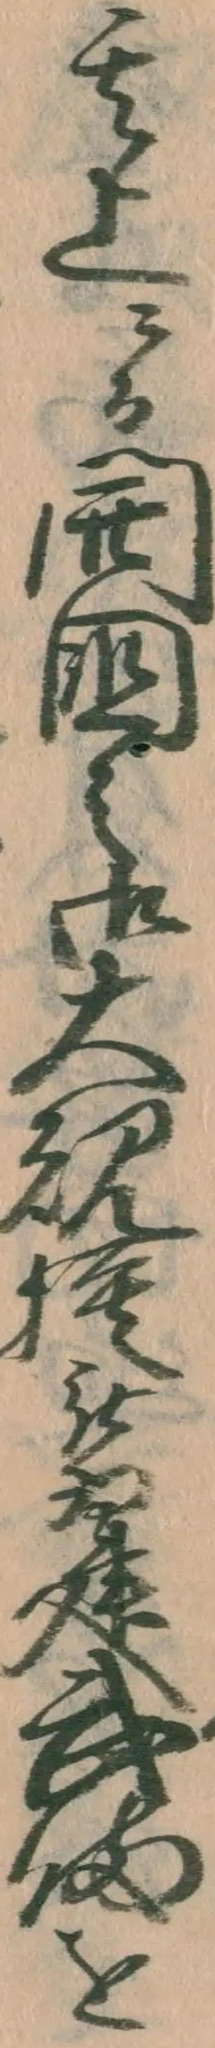其上ニ而開国之御大規模被為建武備を
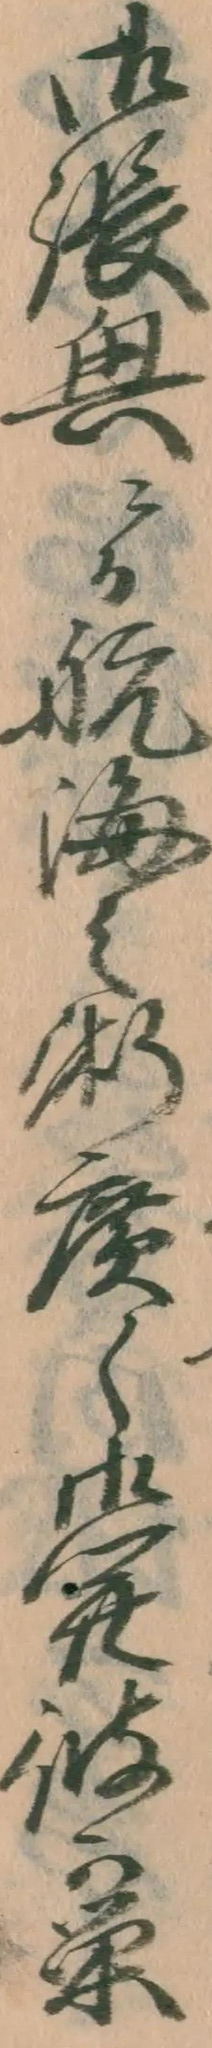御張興ニ而航海之術廣く御開彼か巣
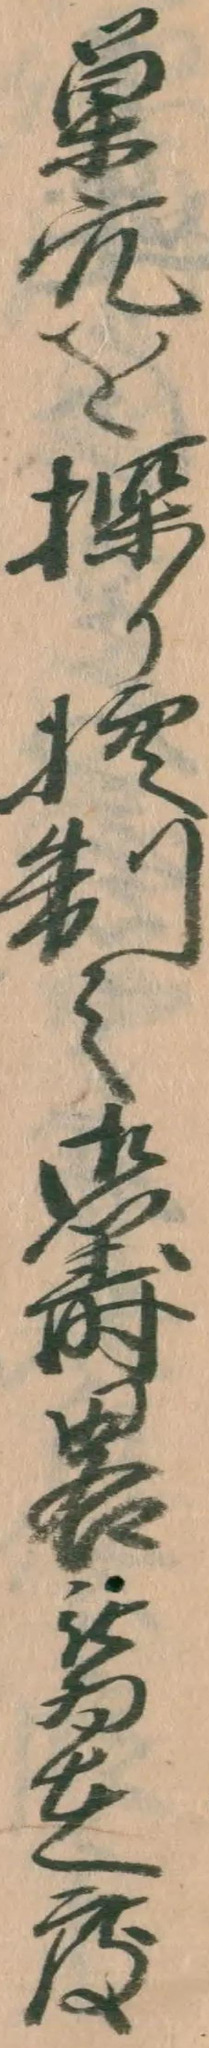巣穴を探り控制之御籌略被為在度
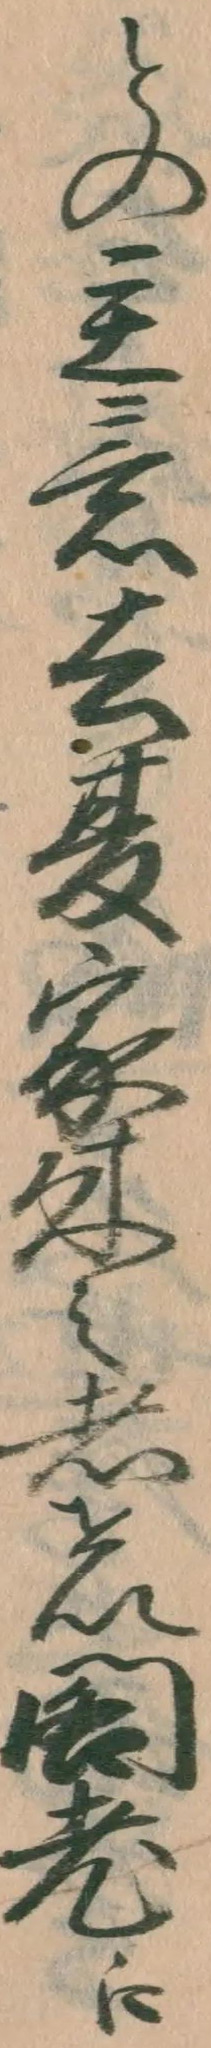との主意去夏家来之者を以閣老え
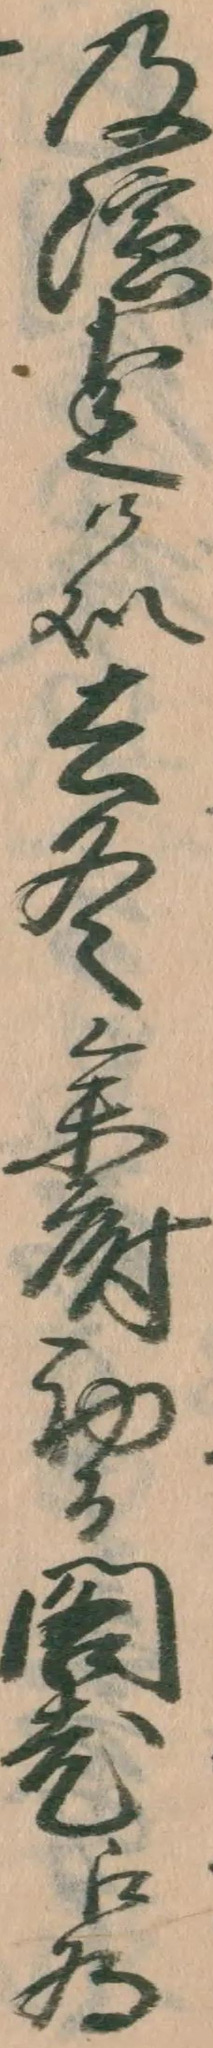及演達候処去冬参府初而閣老え為
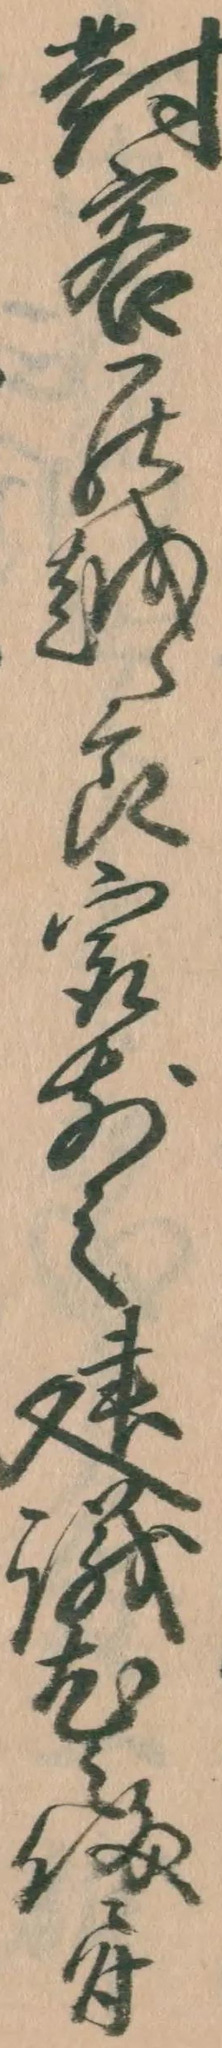對客罷越候節最前之建議尤之儀ニ付
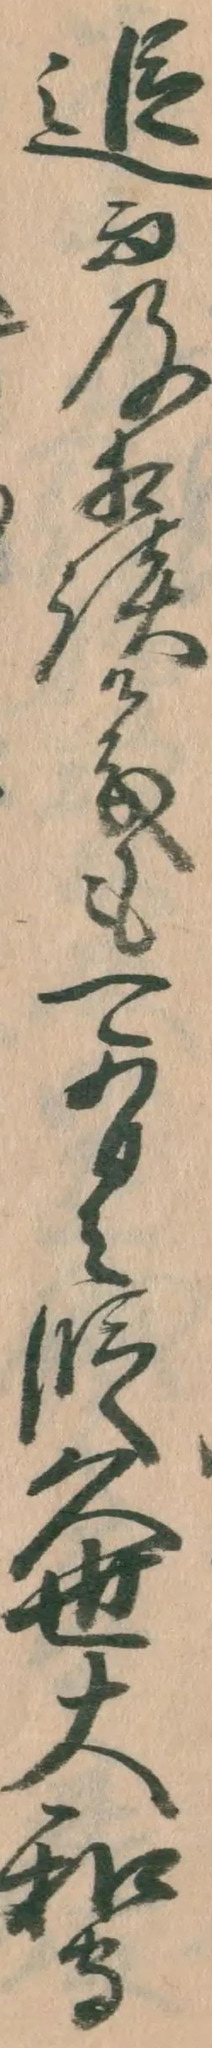追而及相談候義も可有之段久世大和守
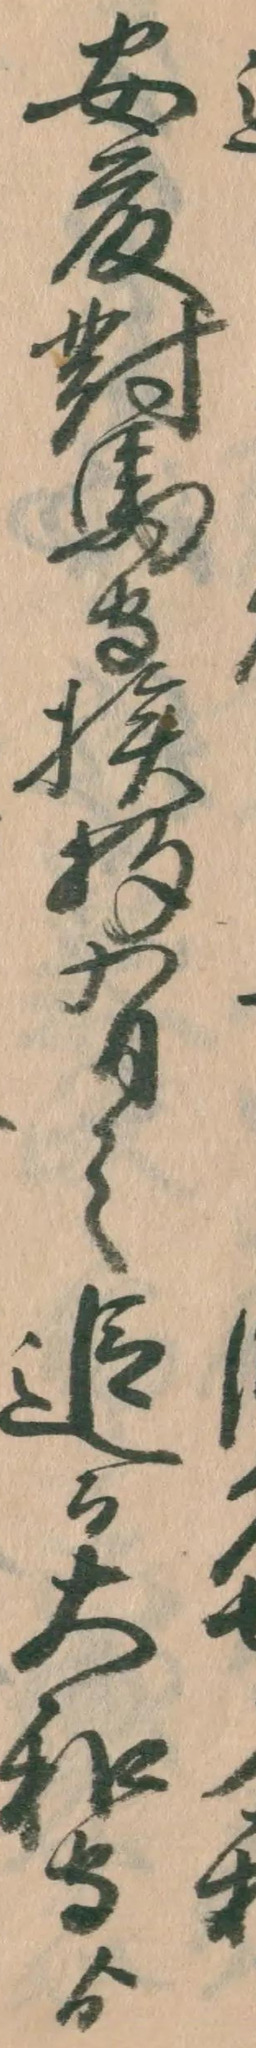安藤對馬守挨拶有之追而大和守より
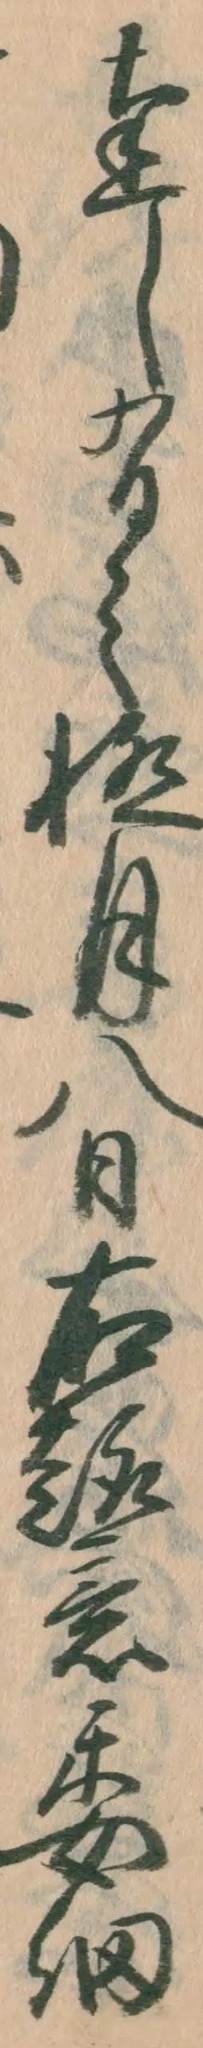達し有之極月八日右趣意委細
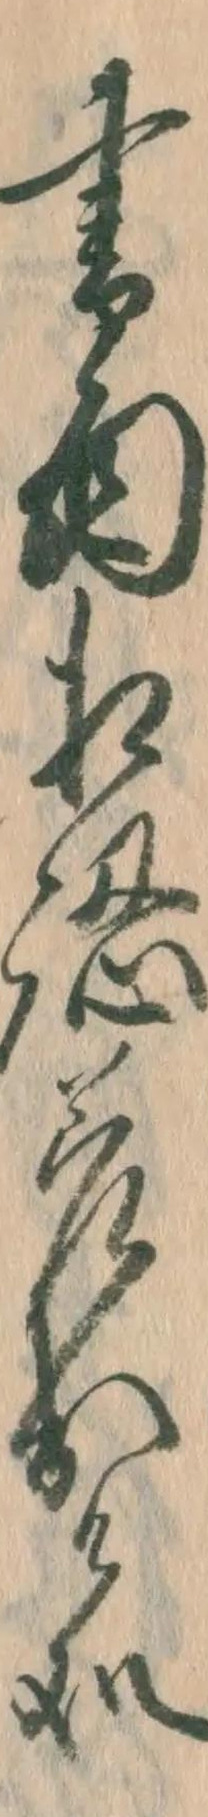書面相認差出候処
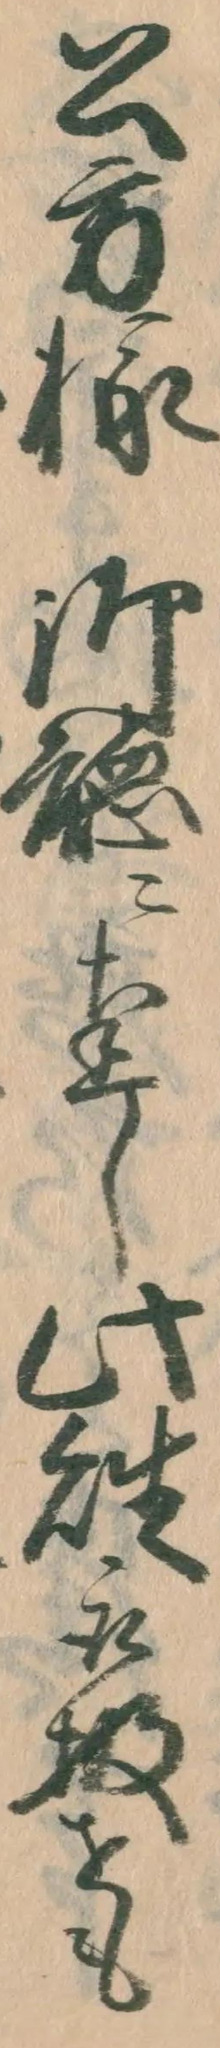公方様御聴ニ達し此往取扱をも
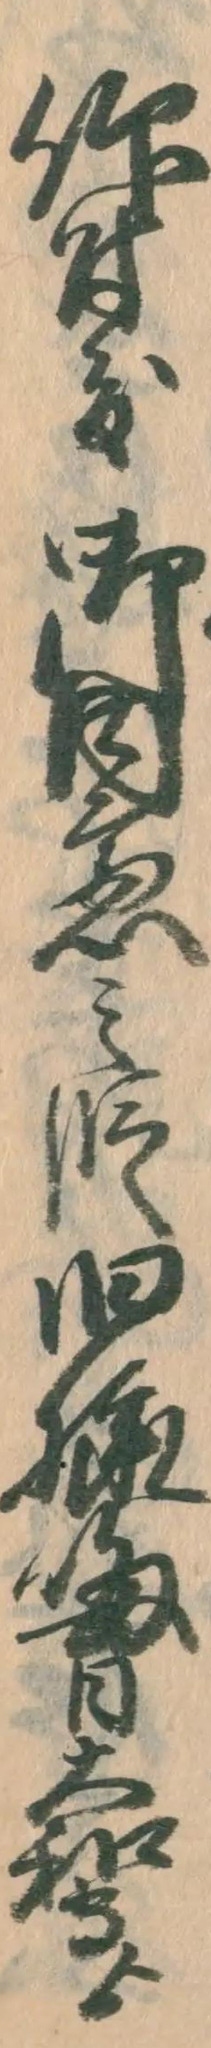被仰付度御内慮之段旧臘晦日大和守より

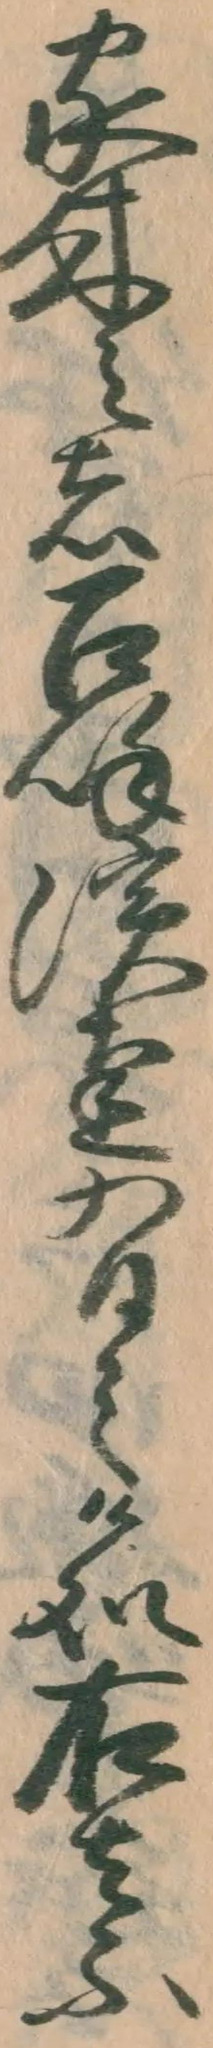家来之者召呼演達有之候処右者不
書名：麗斎叢書. 20
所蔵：国立国会図書館 National Diet Library, JAPAN
